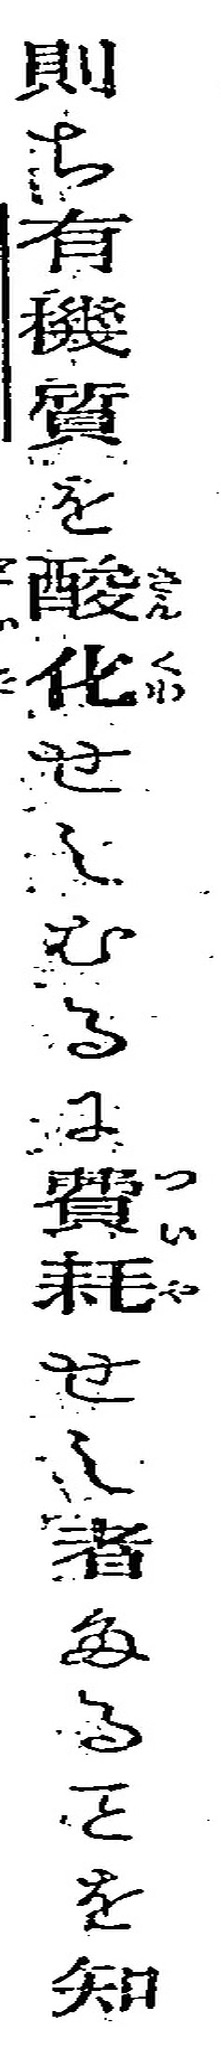則ち有機質を酸化せしむるに費耗せし者たることを知

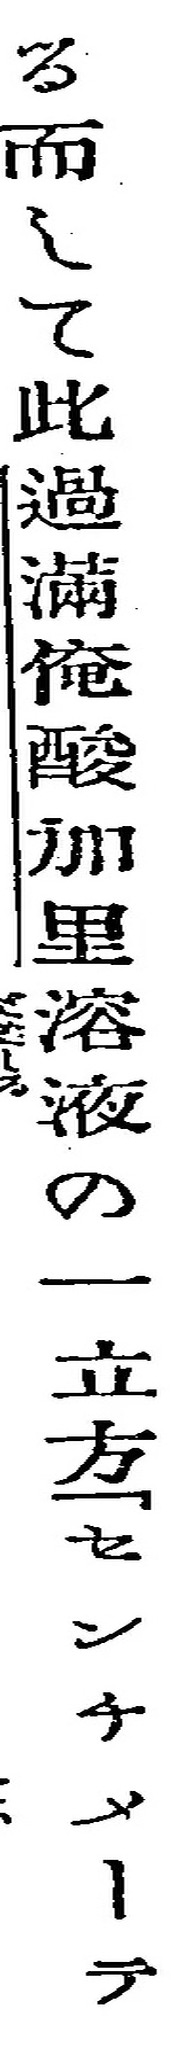る而して此過滿俺酸加里溶液の一立方[センチメーテ
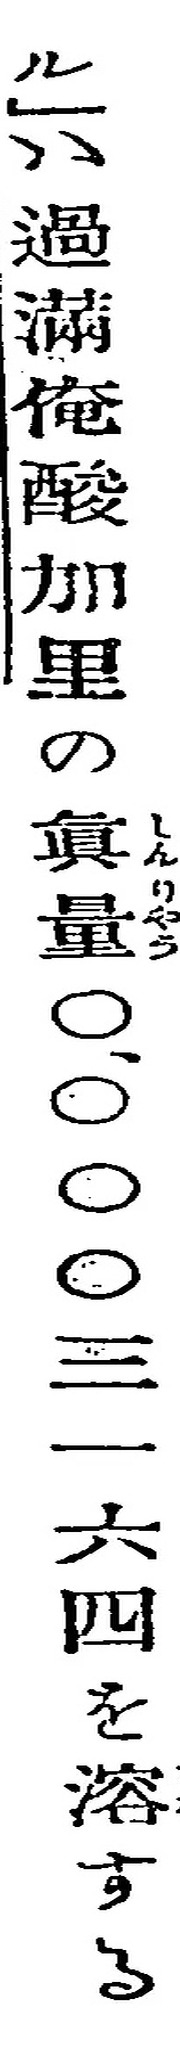ル]は過滿俺酸加里の眞量〇、〇〇〇三一六四を溶する
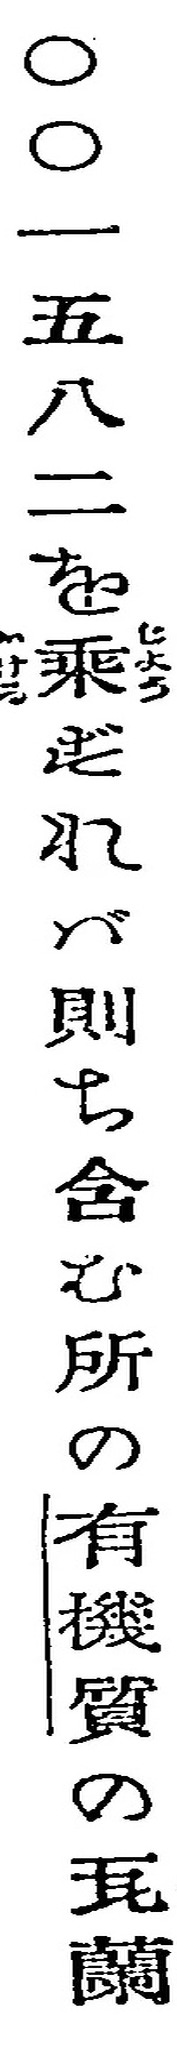〇〇一五八二を乗ずれば則ち含む所の有機質の瓦蘭
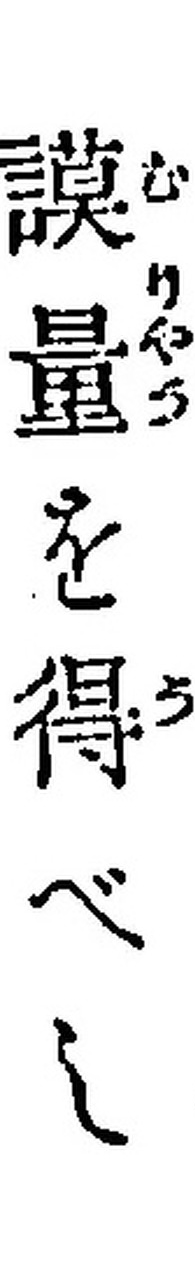謨量を得べし
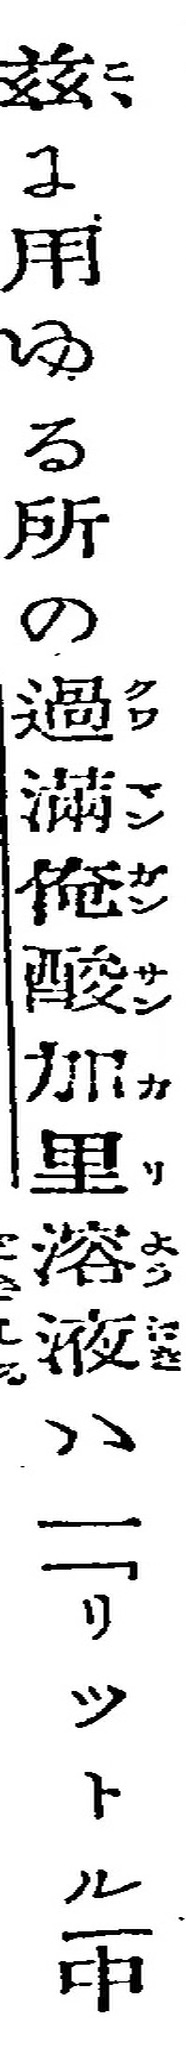茲に用ゆる所の過滿俺酸加里溶液は[リツトル]中
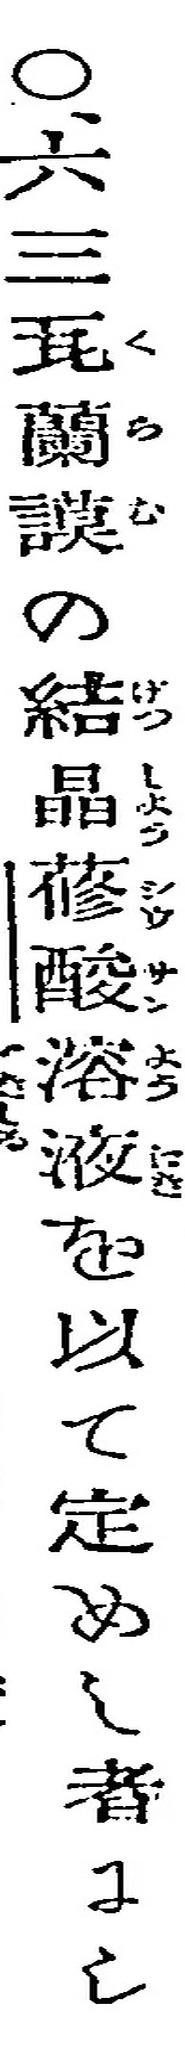〇、六三瓦蘭謨の結晶蓚酸溶液を以て定めし者にし
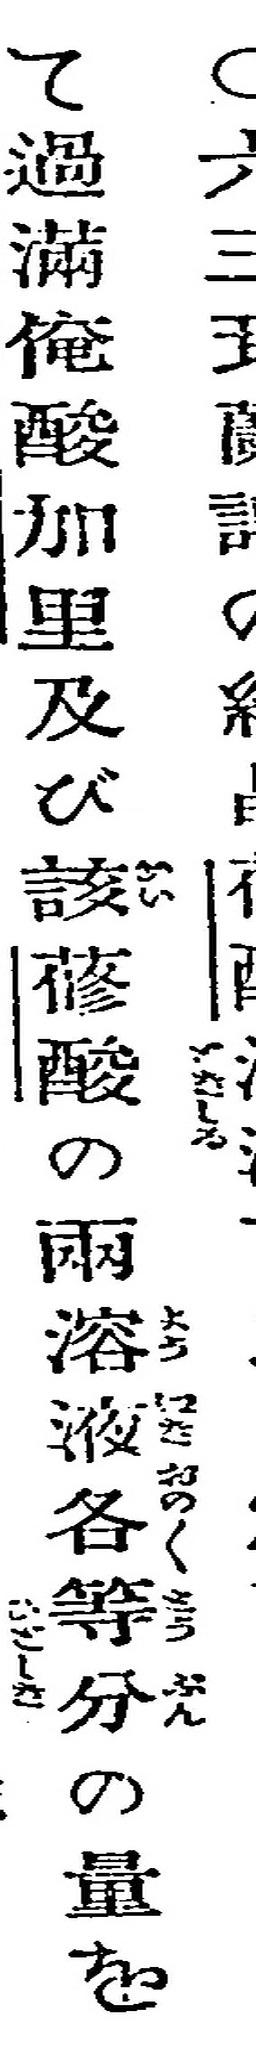て過滿俺酸加里及び該蓚酸の両溶液各々等分の量を
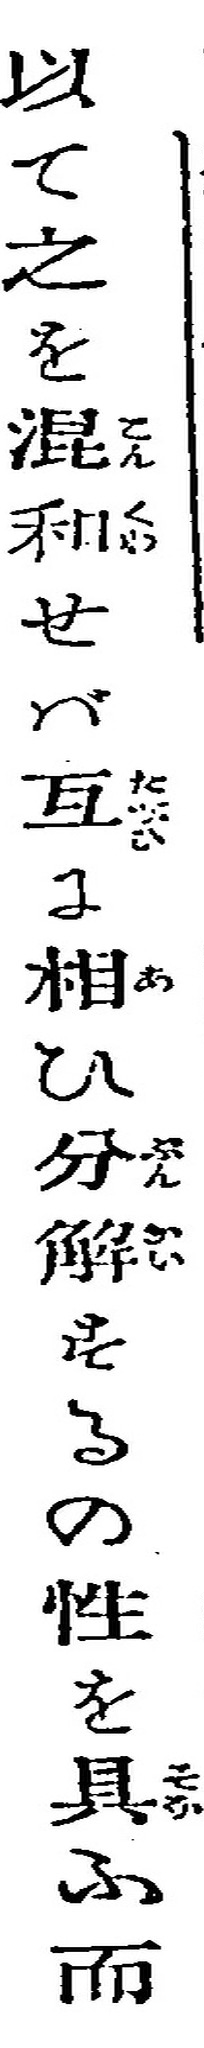以て之を混和せば互に相ひ分解するの性を具ふ而
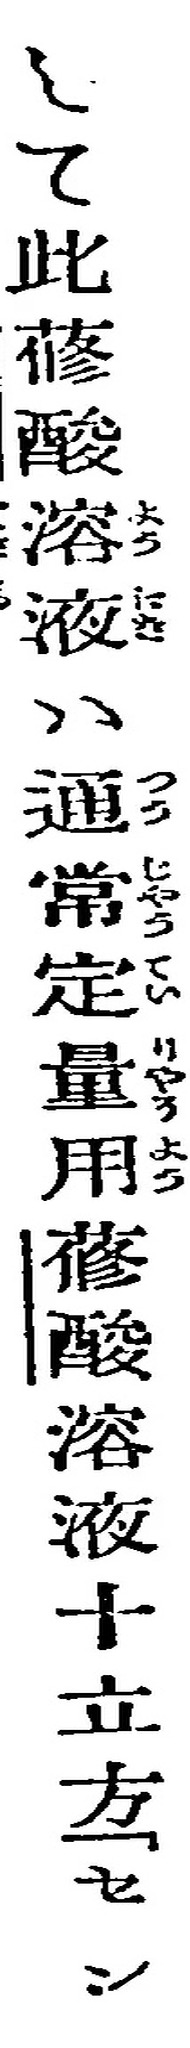して此蓚酸溶液は通常定量用蓚酸溶液十立方[セン
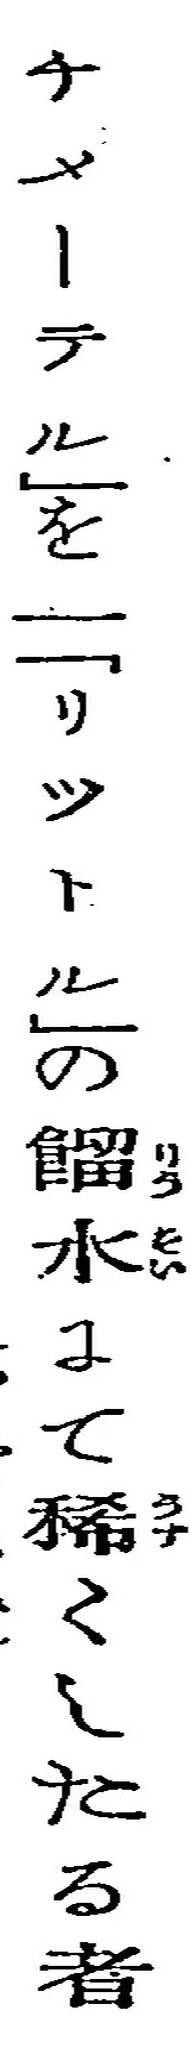チメーテル]を[リツトル]の餾水にて稀くしたる者
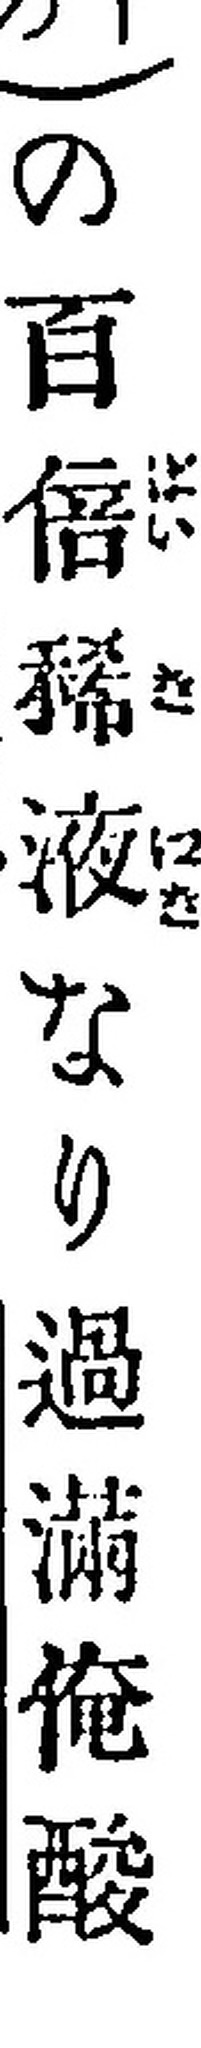百倍稀液なり過滿俺酸
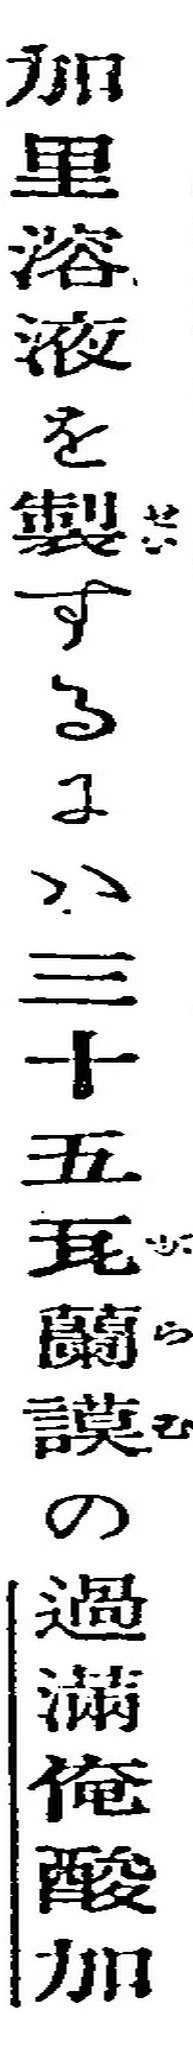加里溶液を製するには三十五瓦蘭膜の過滿俺酸加
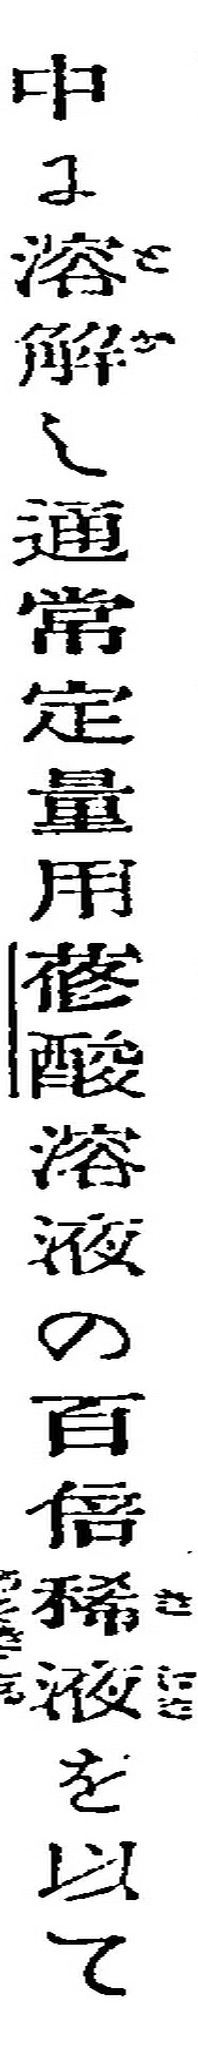中に溶解し通常量用蓚酸溶液の百倍希液を以て
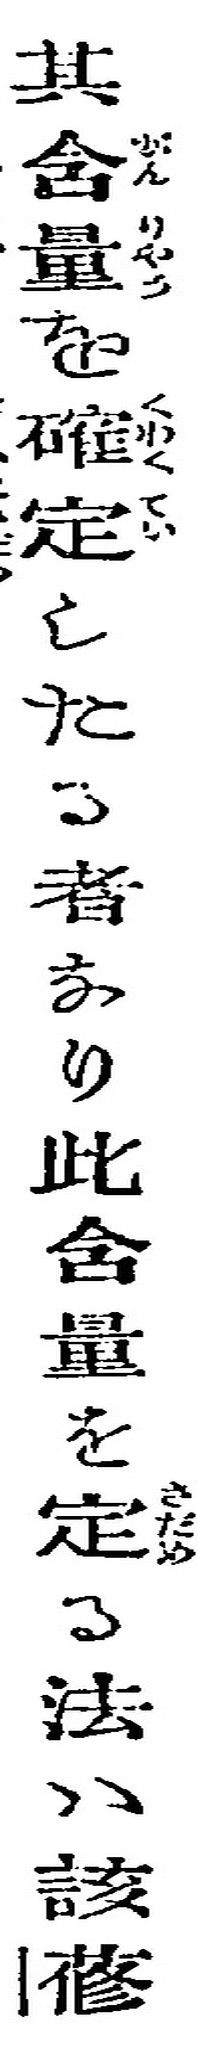其含有を確定したる者なり此含量を定つ法は該蓚
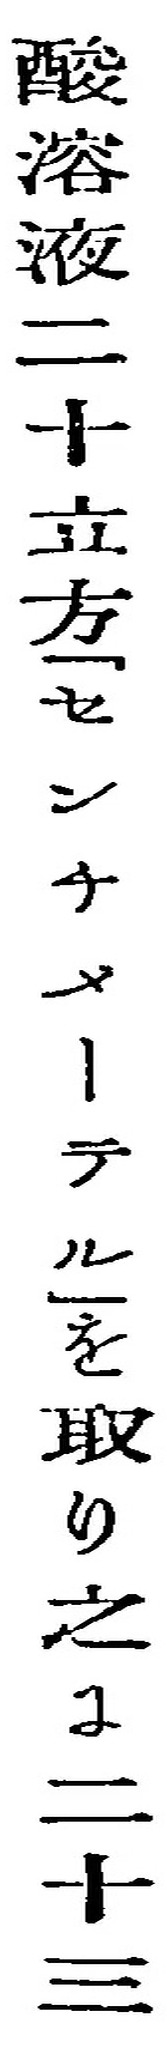酸溶液二十立方[センチメーテル]を取り之に二十三
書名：飲水の心得 : 伝染病の予防
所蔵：国立国会図書館 National Diet Library, JAPAN
